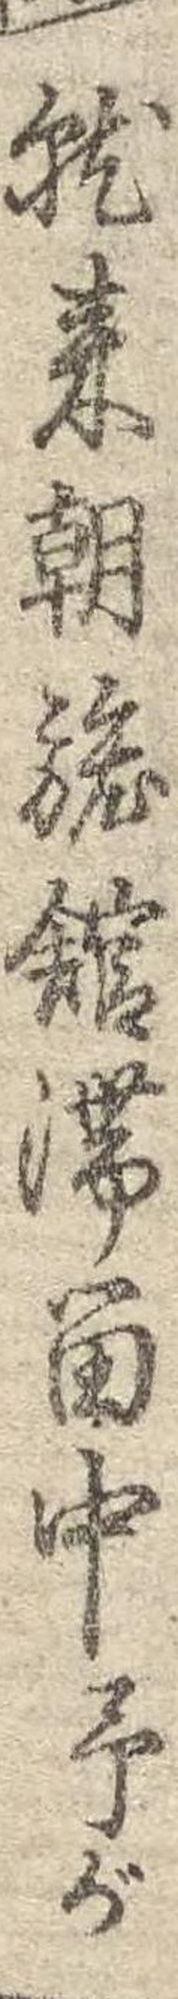就来朝旅館滞留中予が
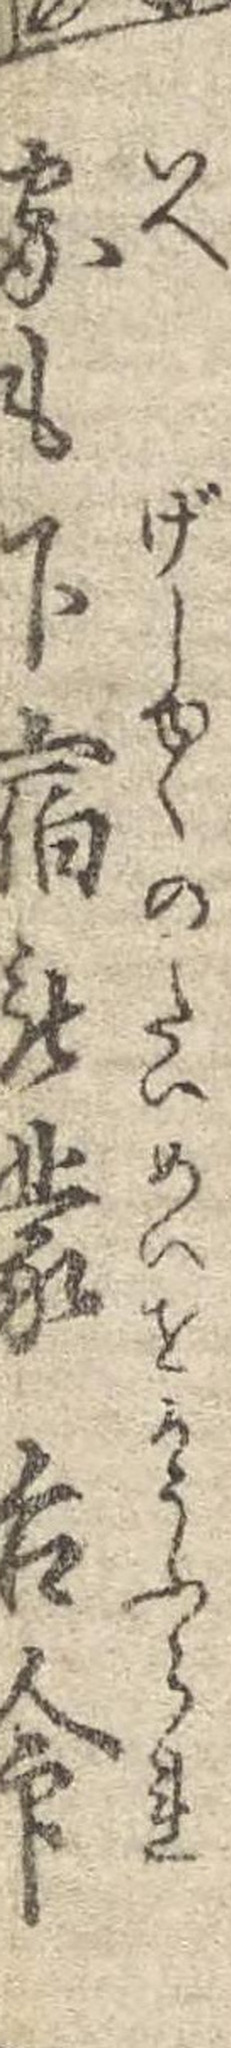家も下宿被蒙台命
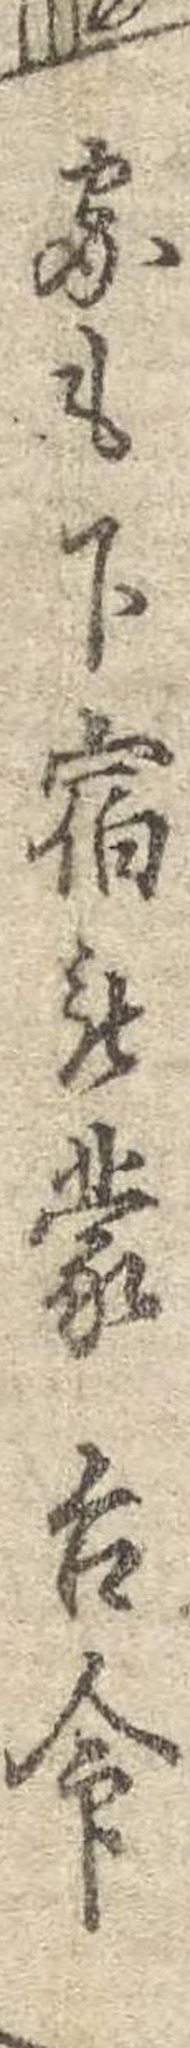家も下宿被蒙台命
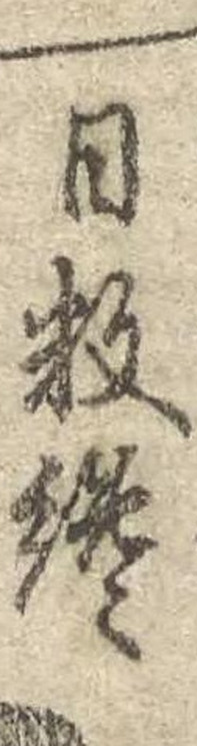日数纔
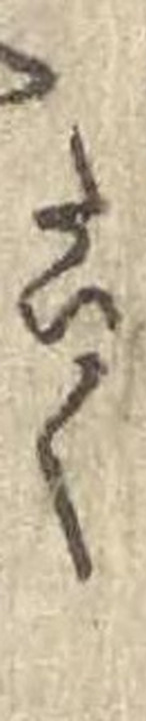たい〳〵
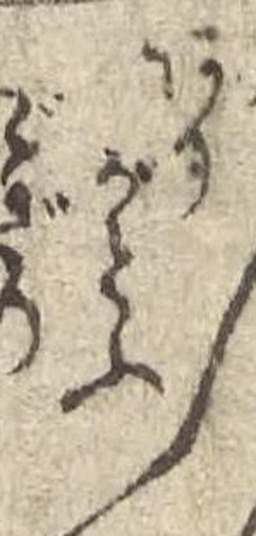ござり
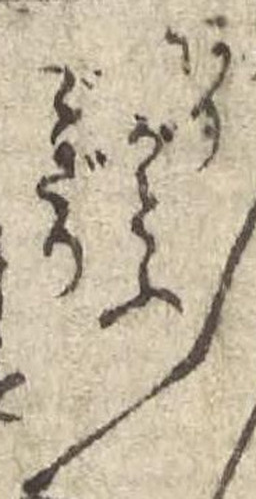ござり
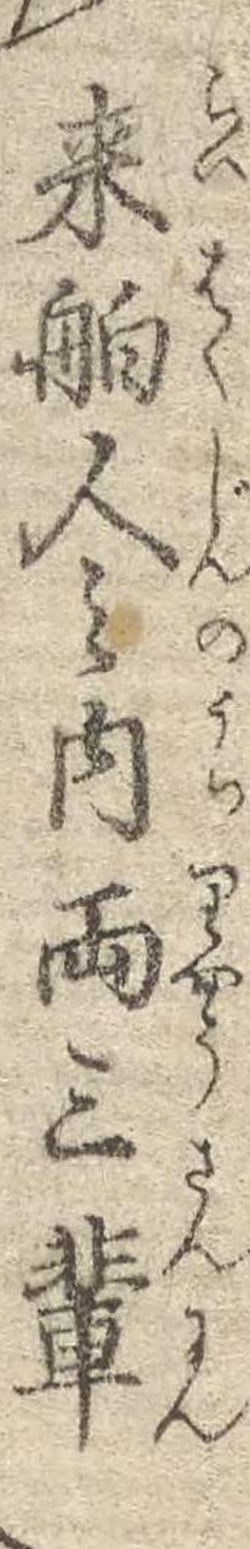来舶人之内両三輩
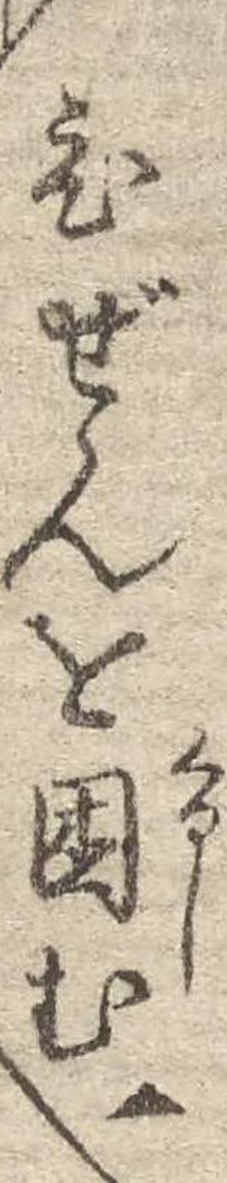ひぜんを困む▲
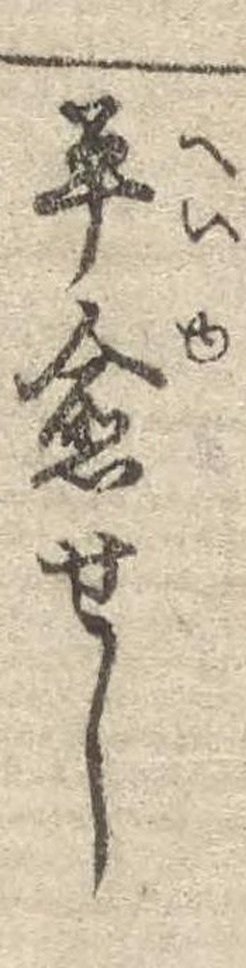平愈せし
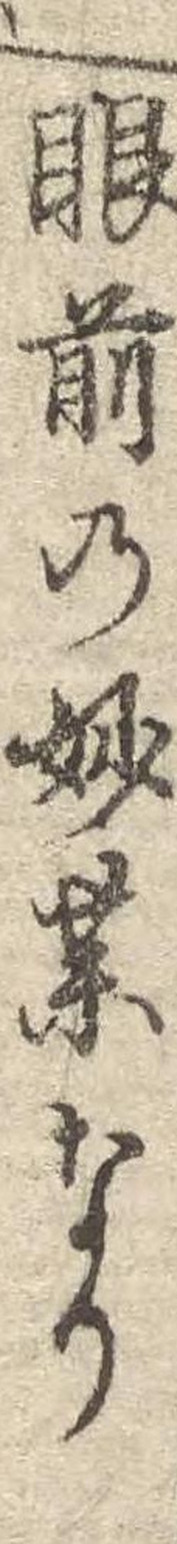眼前の妙薬なり
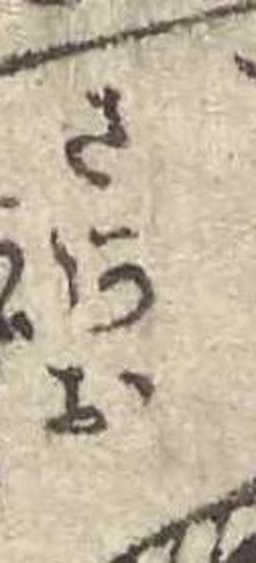さあお
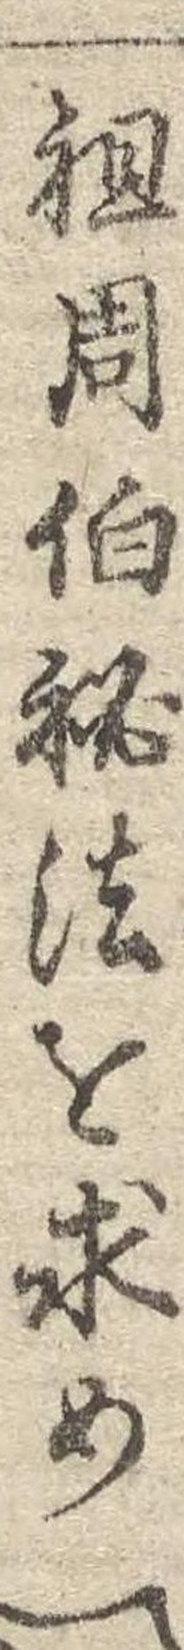祖周伯秘法を求め
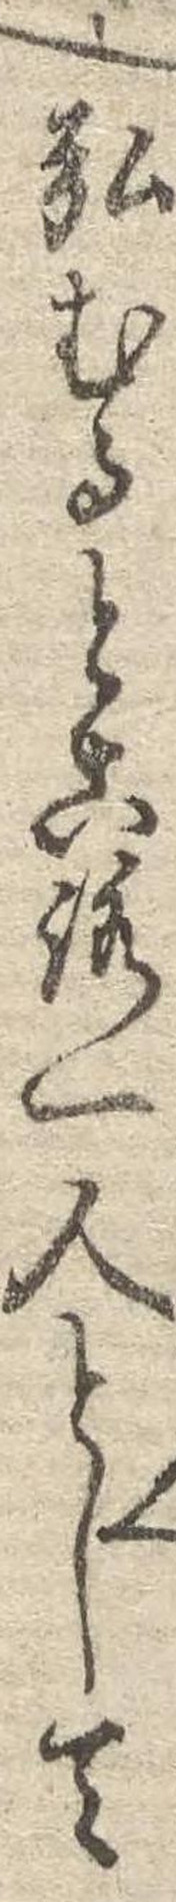弘むるところ一人として
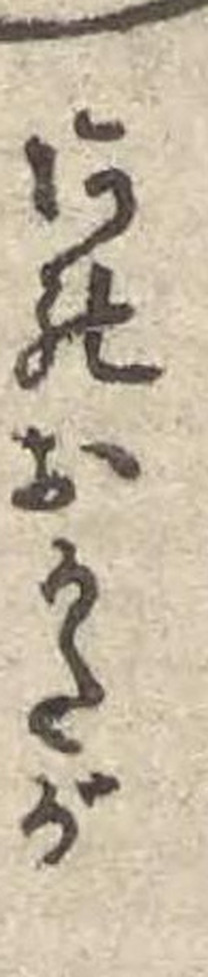あのおかたが
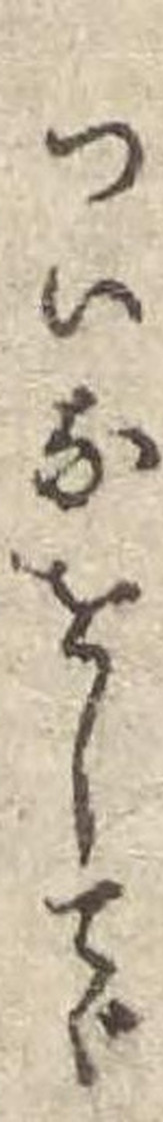ついなをしてゞ
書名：浪華薬種問屋能書張交帖. 一
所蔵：国立国会図書館 National Diet Library, JAPAN
